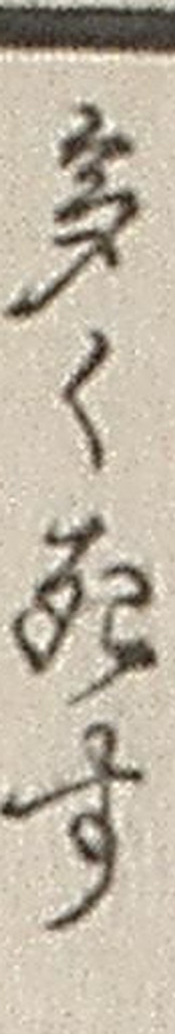多く死す
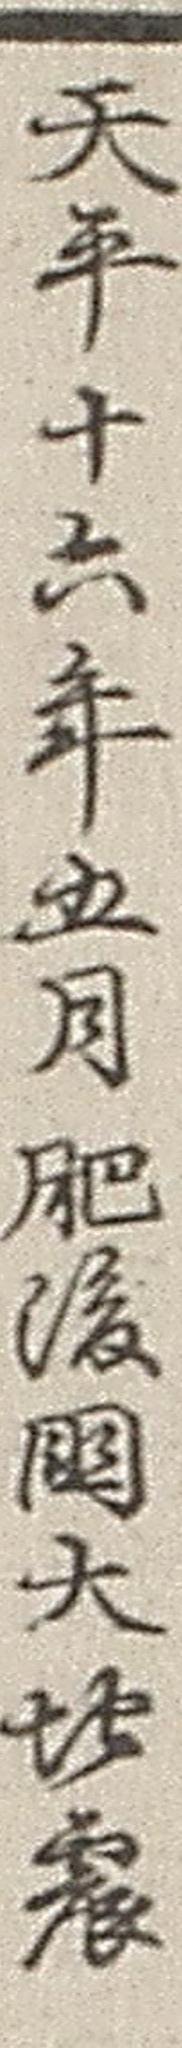天平十六年五月肥後国大地震
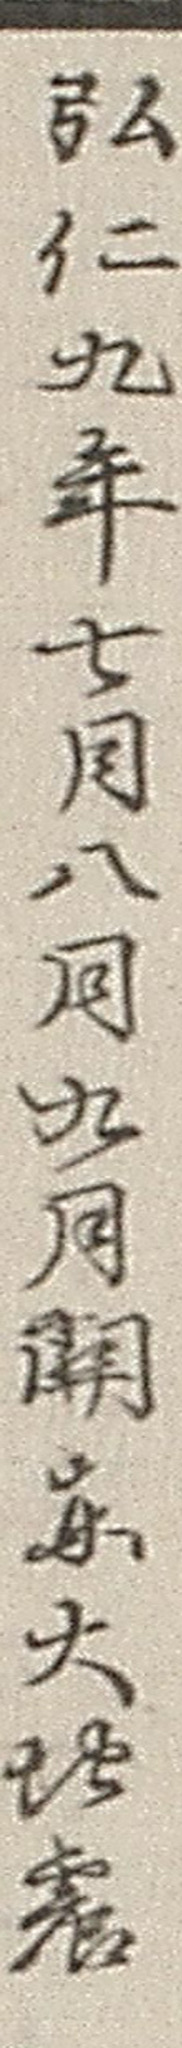弘仁九年七月八月九月関東大地震
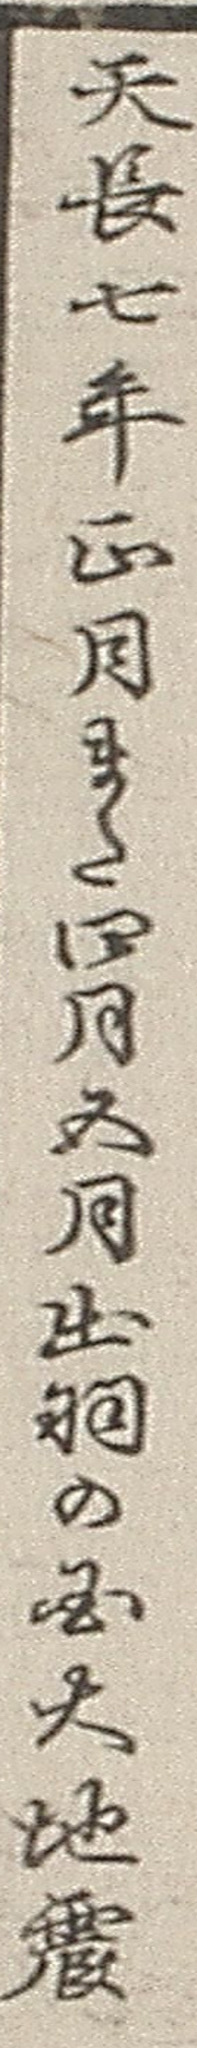天長七年正月また四月五月出羽の国大地震
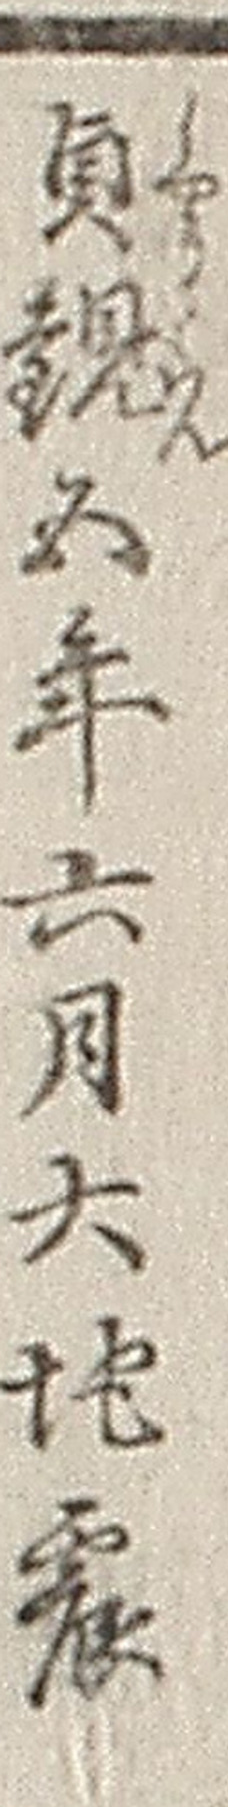貞観五年六月大地震
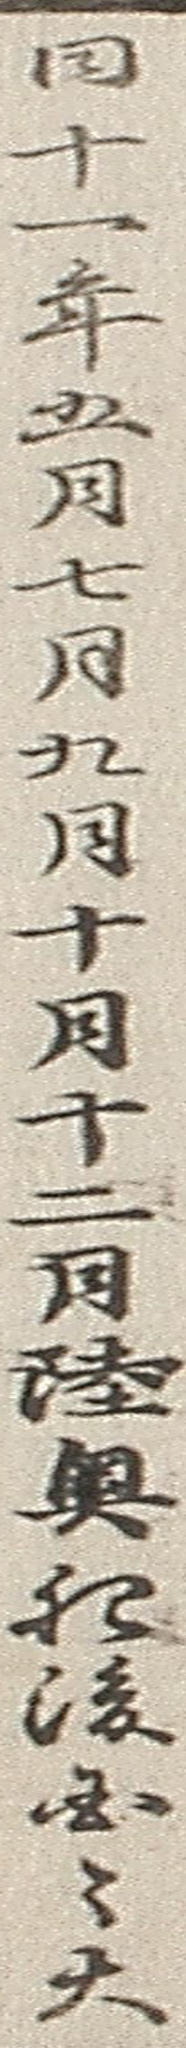同十一年五月七月九月十月十二月陸奥肥後国〻大

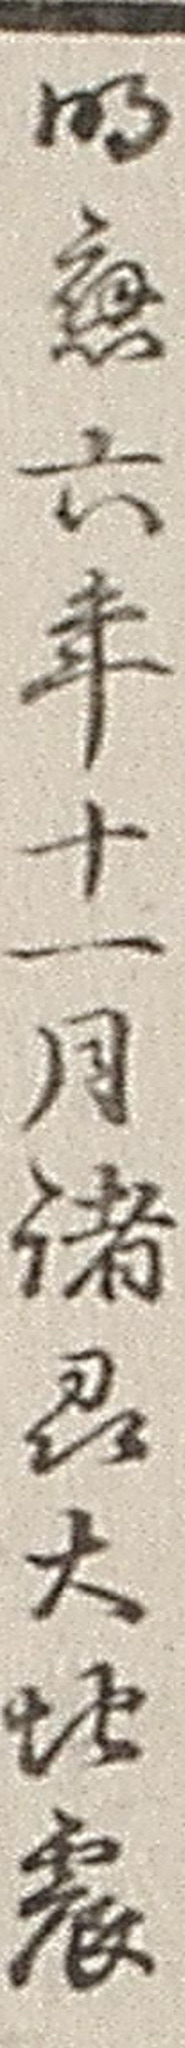明應六年十一月諸州大地震
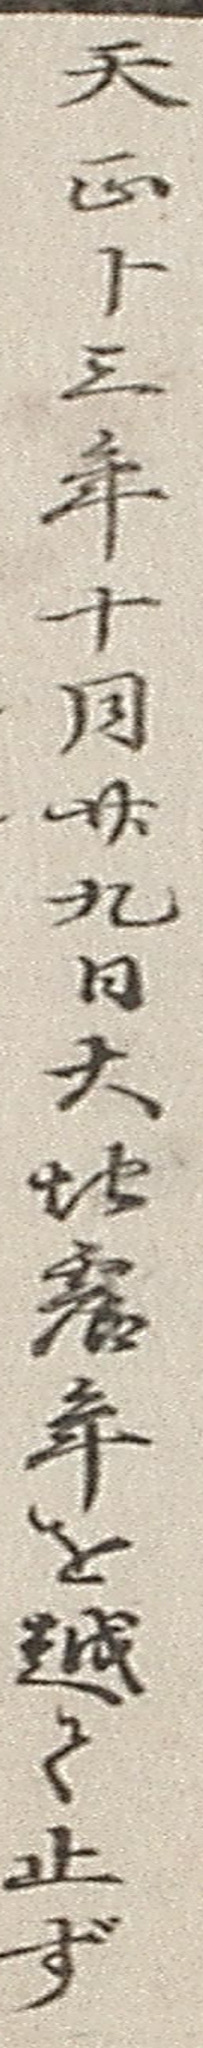天正十三年十月廿九日大地震年を越て止ず
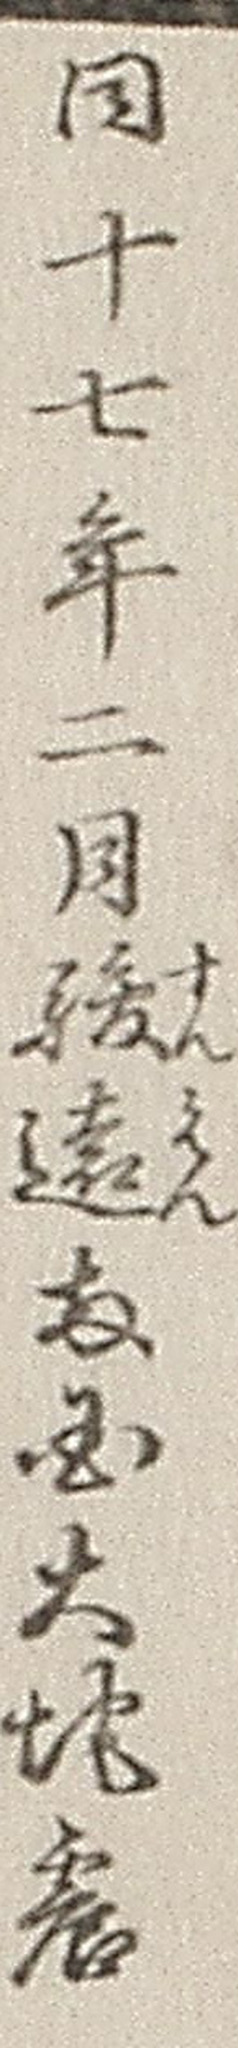同十七年二月駿遠両国大地震
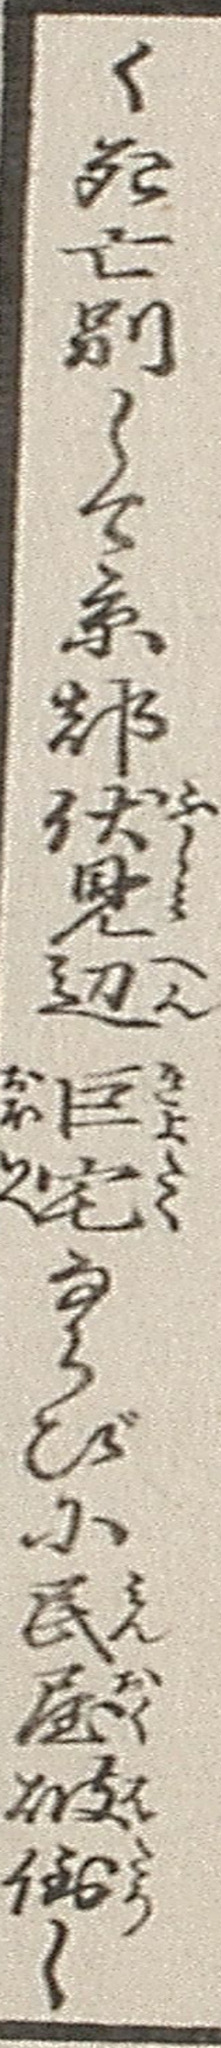く死亡別して京都伏見辺巨宅おほいへならびに民屋破倒し
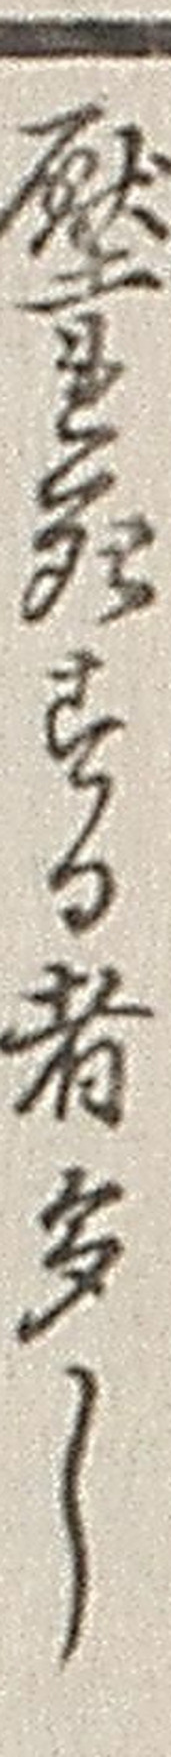壓れ死する者多し
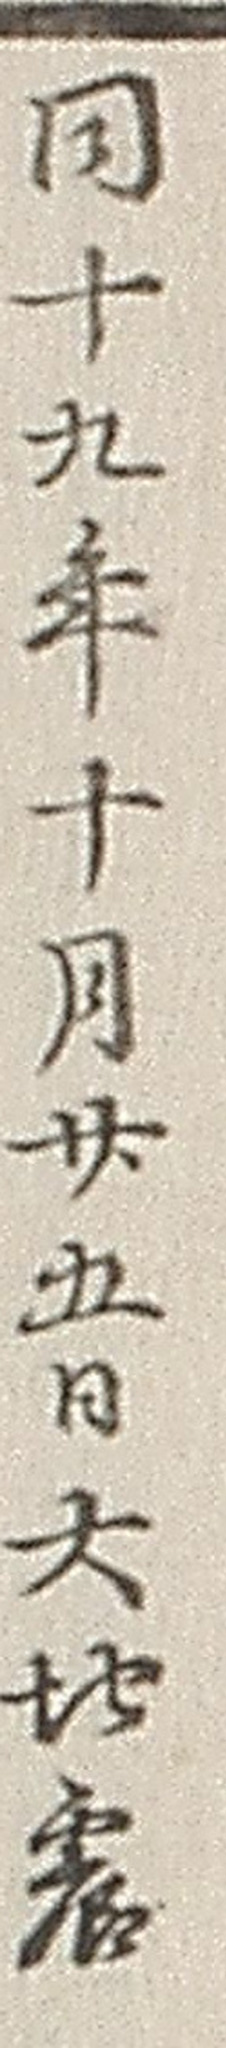同十九年十月廿五日大地震
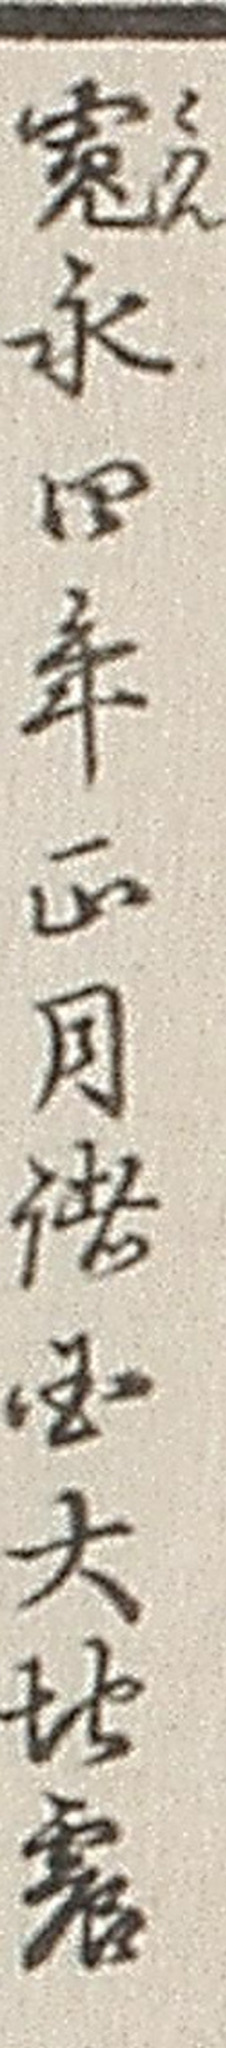寛永四年正月諸国大地震
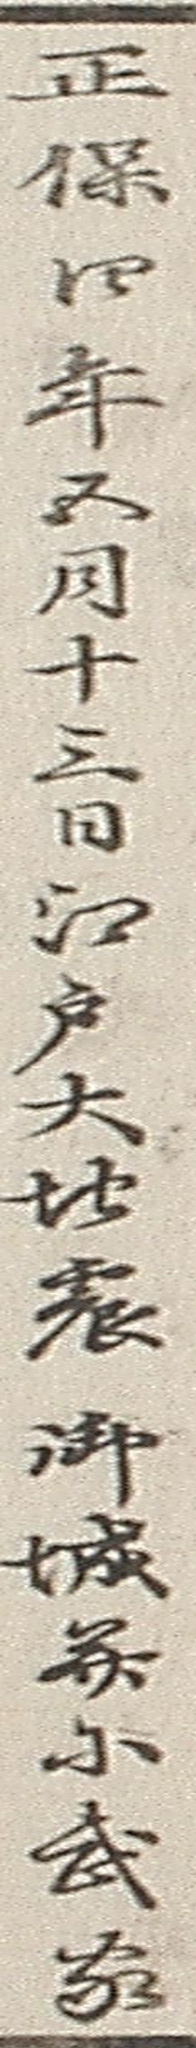正保四年五月十三日江戸大地震御城并に武家
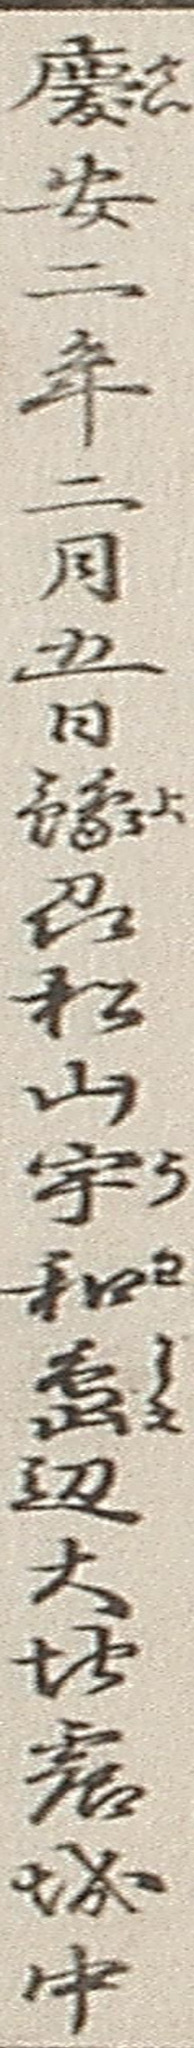慶安二年二月五日豫州松山宇和島辺大地震城中

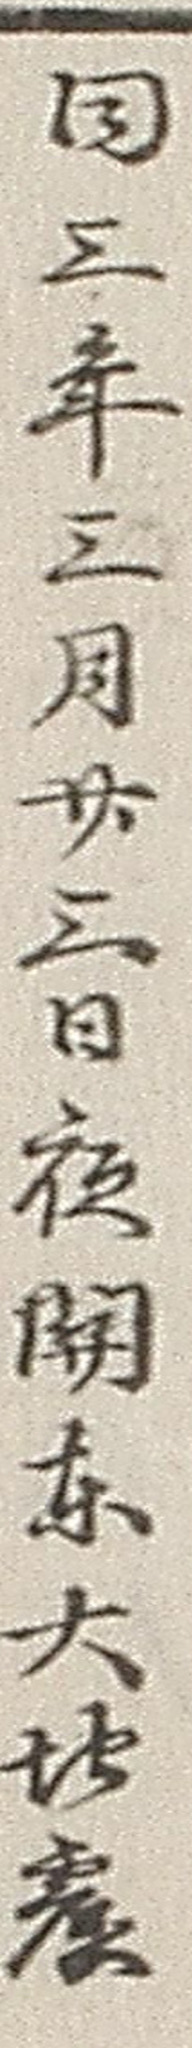同三年三月廿三日夜関東大地震
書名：大地震暦年考　全
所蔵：東京大学地震研究所図書室 Earthquake Research Institute Library, The University of Tokyo, JAPAN
